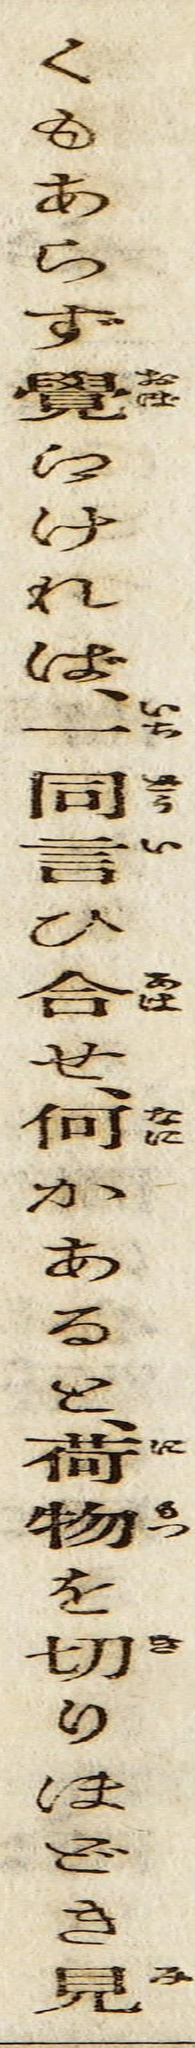くもあらず覚えければ、一同言ひ合せ、何かあると、荷物を切りほどき見
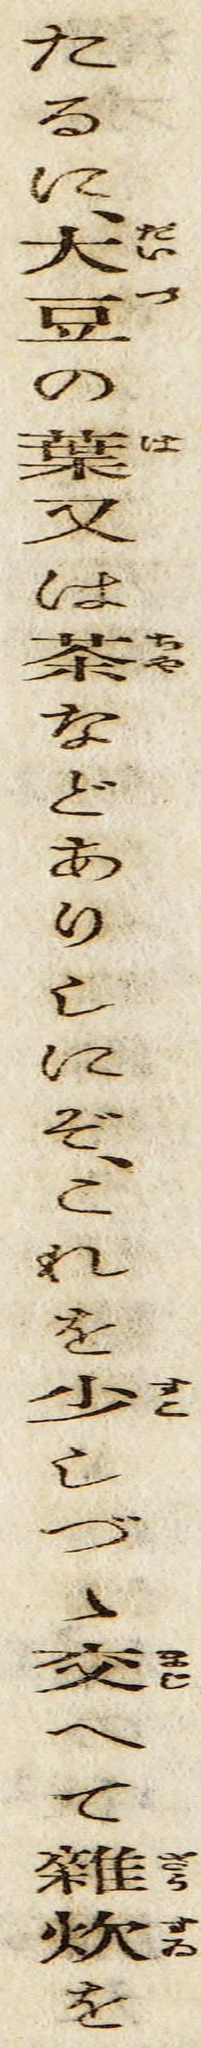たるに、大豆の葉又は茶などありしにぞ、これを少しづゝ交へて雑炊を
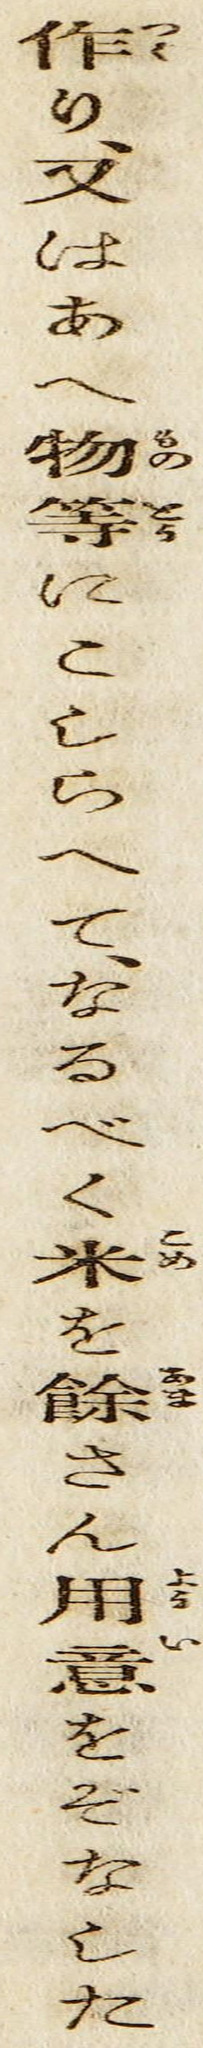作り、又はあへ物等にこしらへて、なるべく米を余さん用意をぞなした
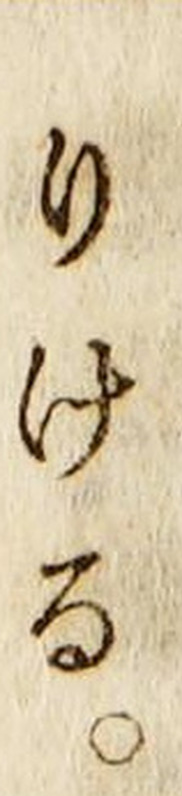りける。
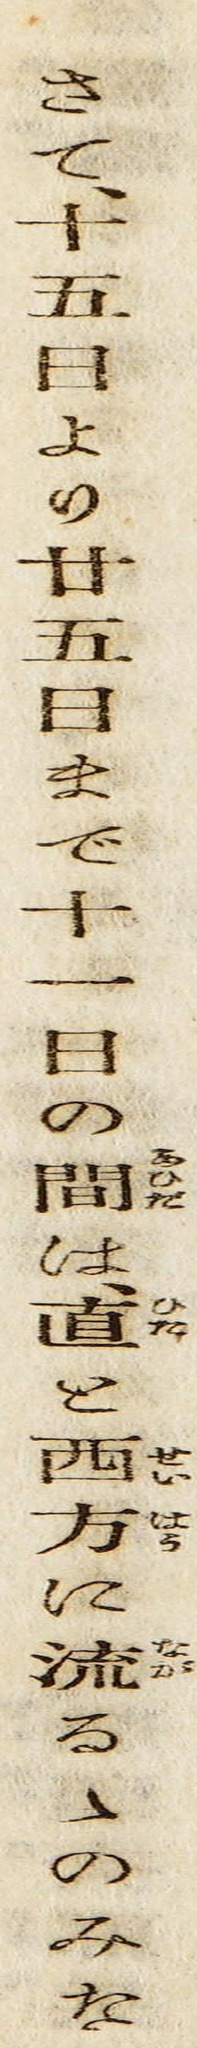さて、十五日より廿五日まで十一日の間は、直と西方に流るゝのみな
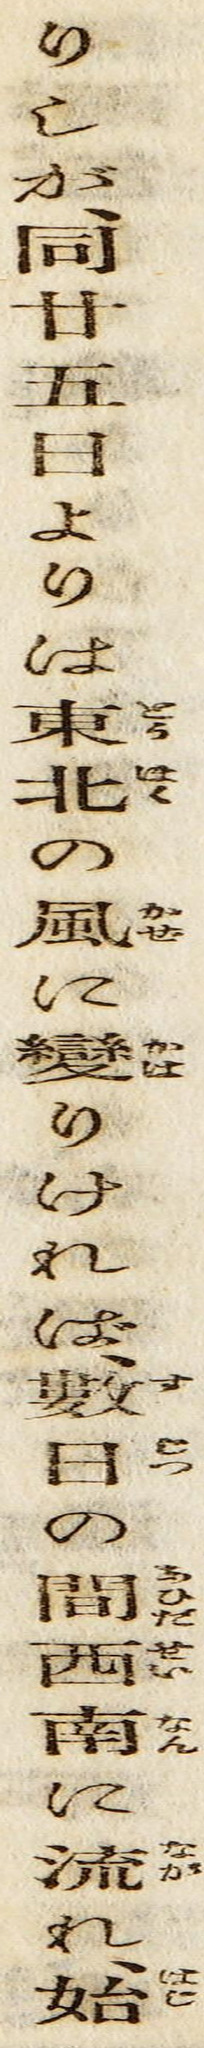りしが、同廿五日よりは東北の風に変りければ、数日の間西南に流れ、始
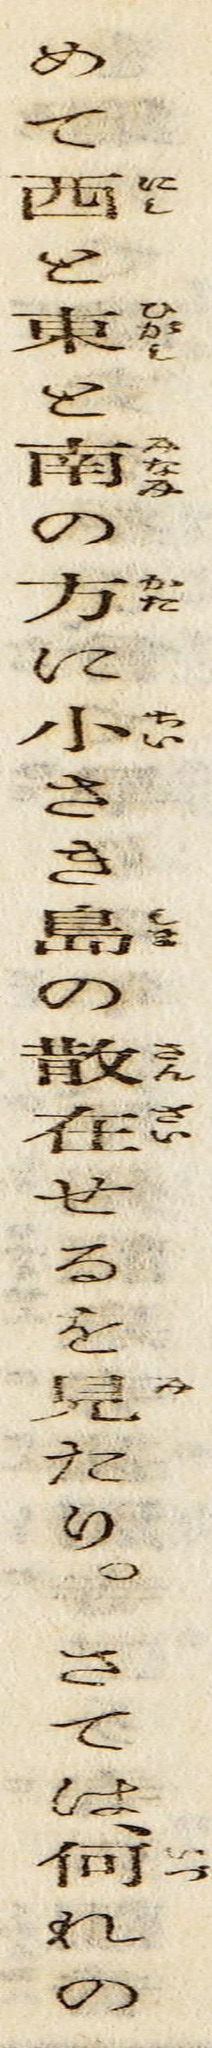めて西と東と南の方に小さき島の散在せるを見たり。さては、何れの
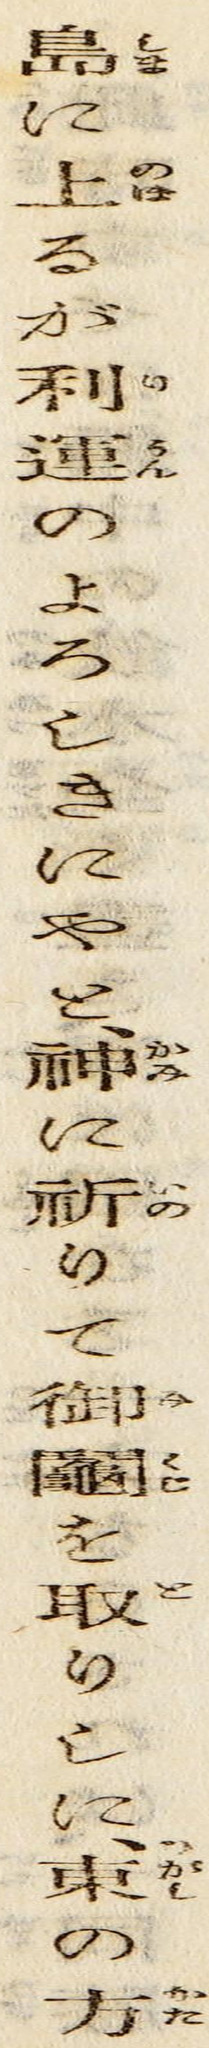島に上るが利運のよろしきにやと、神に祈りて御鬮を取りしに、東の方
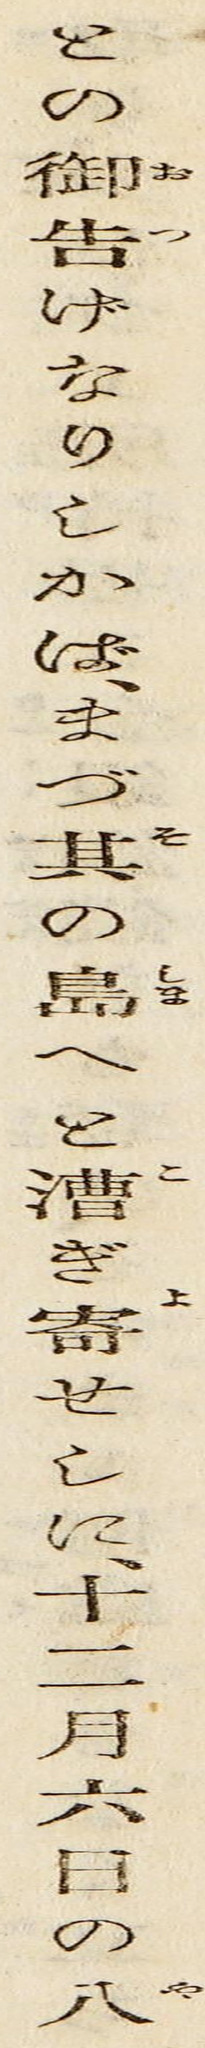との御告げなりしかば、まづ其の島へと漕ぎ寄せしに、十二月六日の八
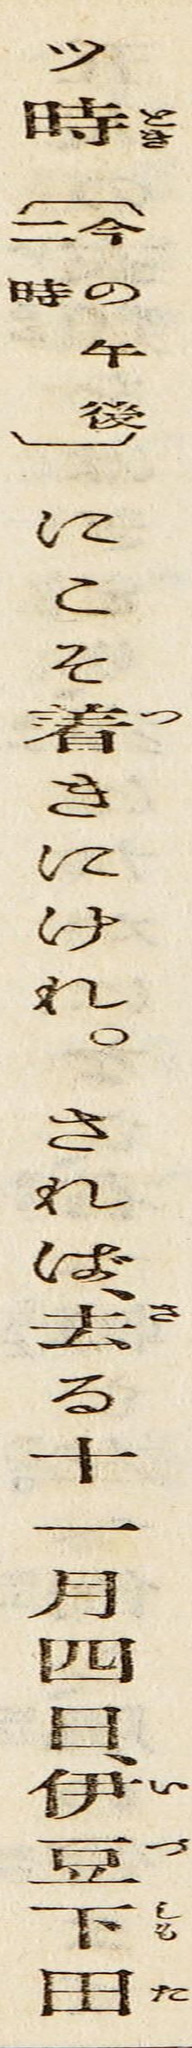ツ時[今の午後二時]にこそ着きにけれ。されば、去る十一月四日、伊豆下田
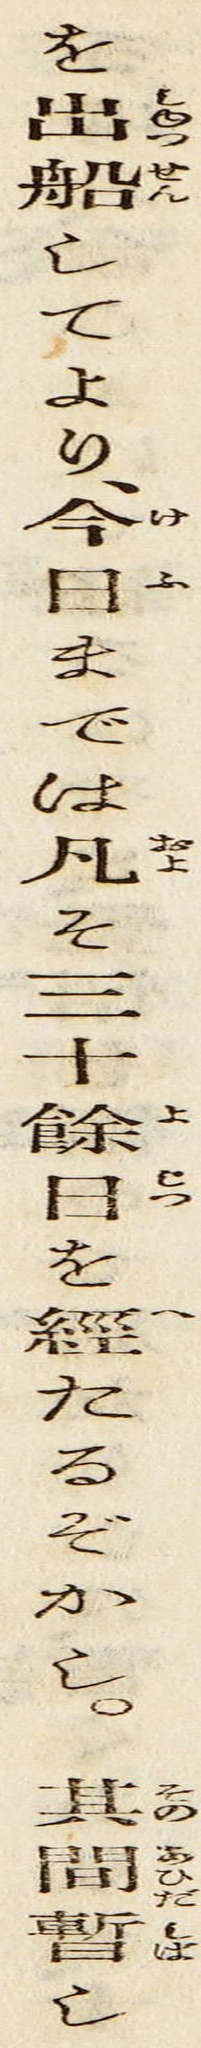を出船してより、今日までは凡そ三十余日を経たるぞかし。其間暫し
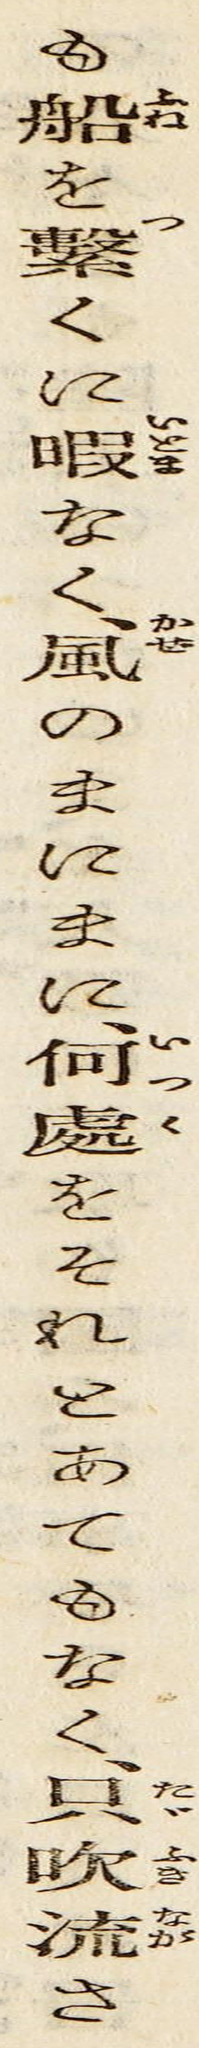も船を繋くに暇なく、風のまにまに、何処をそれとあてもなく、只吹流さ
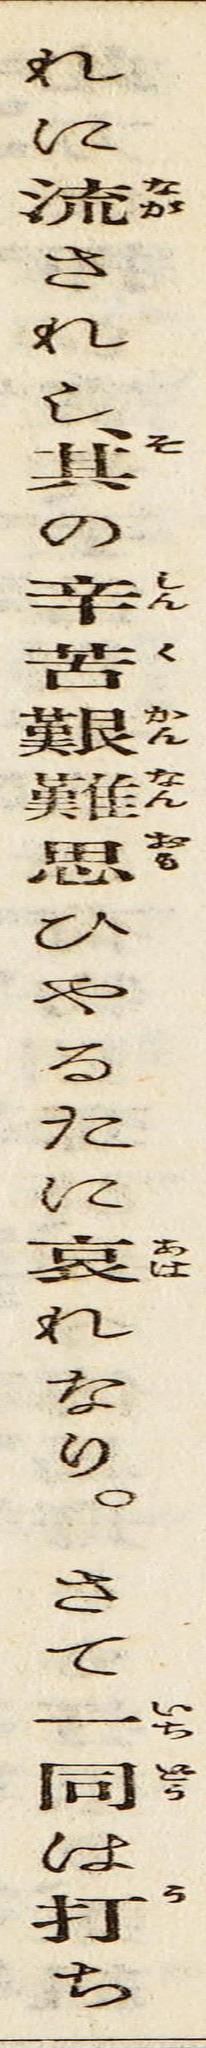れに流されし、其の辛苦艱難思ひやるたに哀れなり。さて一同は打ち
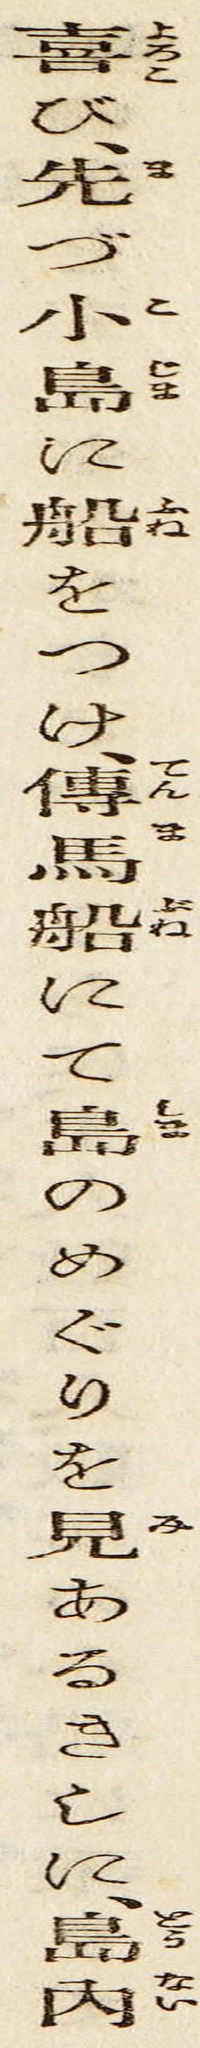喜び、先づ小島に船をつけ、伝馬船にて島のめぐりを見あるきしに、島内
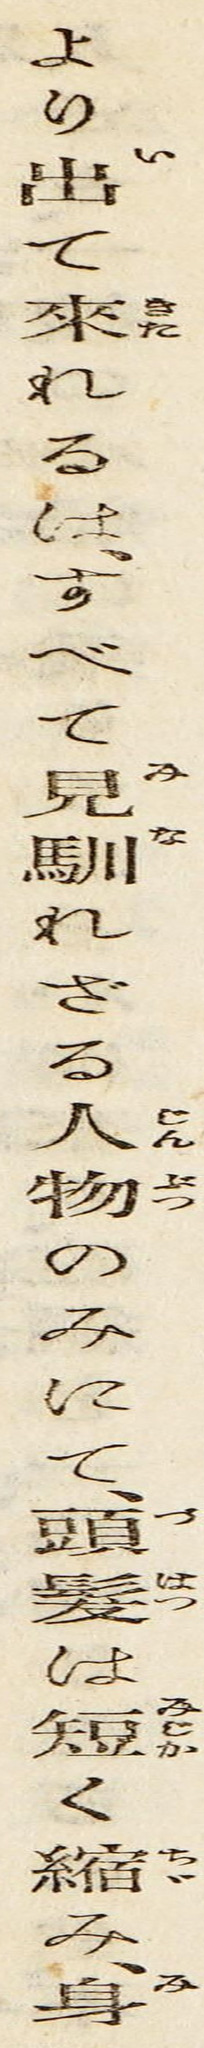より出で来れるは、すべて見馴れざる人物のみにて、頭髪は短く縮み、身
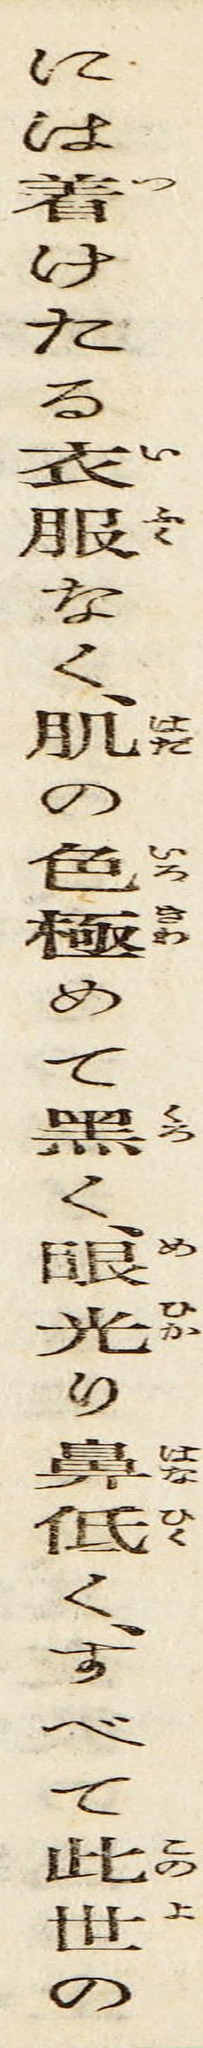には着けたる衣服なく、肌の色極めて黒く、眼光り鼻低く、すべて此世の
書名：日本漂流譚
